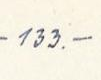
133
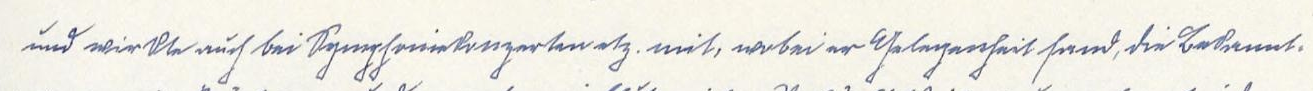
und wirkte auch bei Symphoniekonzerten et. mit, wobei er Gelegenheit fand, die Bekannt-
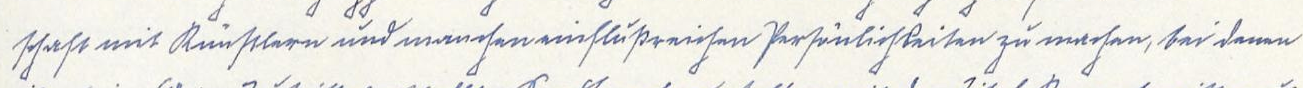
schaft mit Künstlern und manchen ennflußreichen Persönlichkeiten zu machen, bei denen
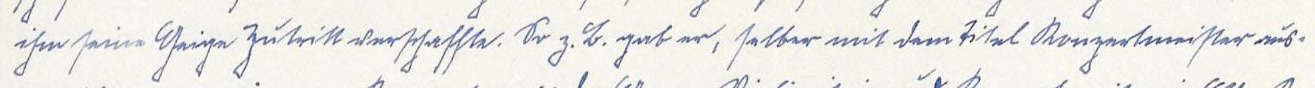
ihm seine Geige Zutritt verschaffte. So z. B. gab er, selber mit dem Titel Konzertmeister ans-
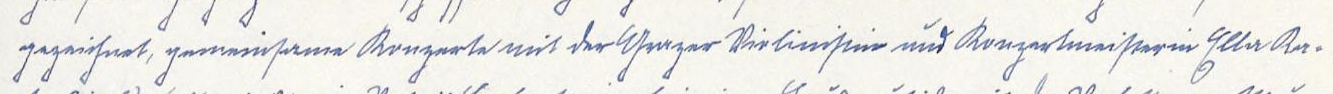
gezeichnet, gemeinsame Konzerte mit der Grazer Violinistin und Konzertmeisterin Ella Ka-
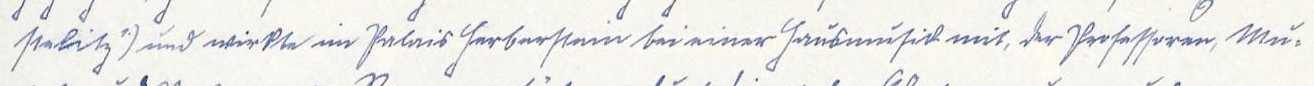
stelitz 1) und wirkte im Palais Herberstein bei einer Hausmusik mit, der Professoren, Mus-
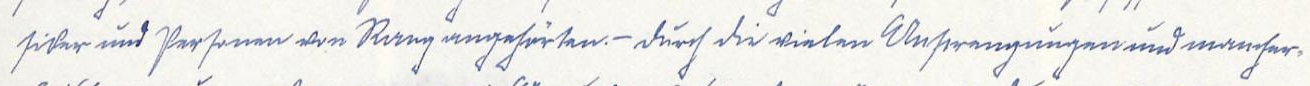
siker und Personen von Rang angehörten.- Durch die vielen Anstrengungen und mancher-
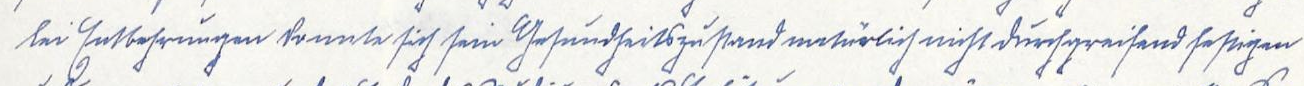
lei Entbehrungen konnte sich sein Gesundheitszustand natürlich nicht durchgreifend festigen
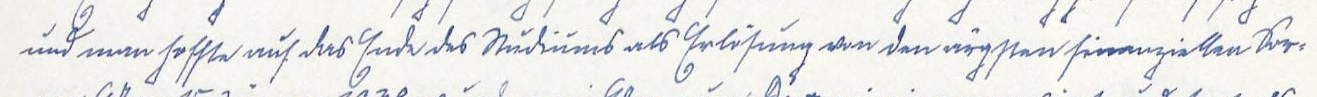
und man hoffte auf das Ende des Studiums als Erlösung von den ärgsten finanziellen Sor-
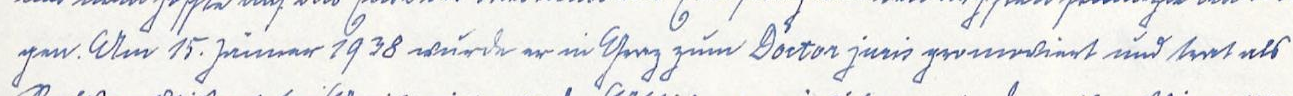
gen. Am 15. Jänner 1938 wurde er in Graz zum Doctor juris promoviert und trat als
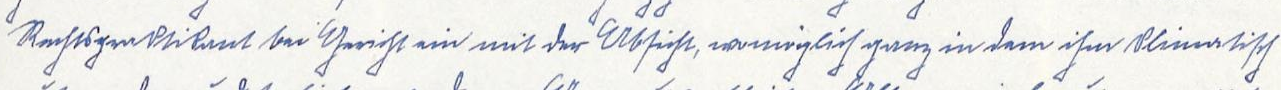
Rechtspraktikant bei Gericht ein mit der Absicht, womöglich ganz in dem ihm klimatisch
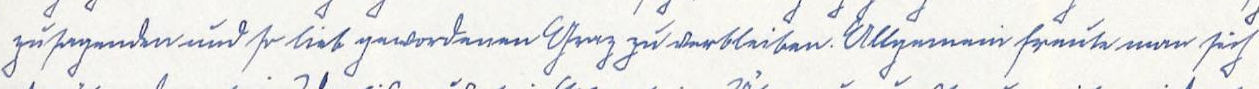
zusagenden und so lieb gewordenen Graz zu verbleiben. Allgemein freute man sich
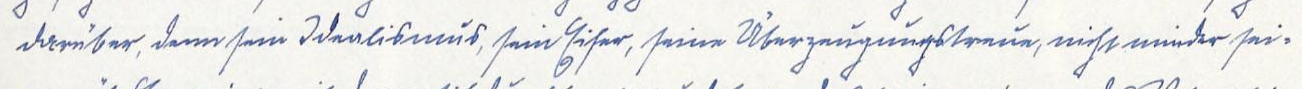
darüber, denn sein Idealismus, sein Eifer, seine Überzeugungstreue, nicht minder sei-
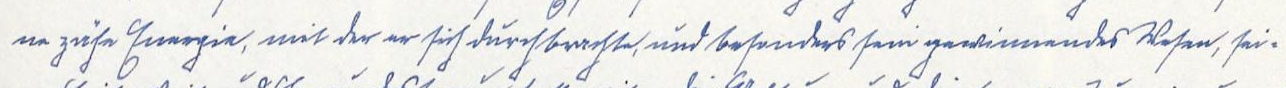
ne zähe Energie, mit der er sich durchbrachte, und besonders sein gewinnendes Wesen, sei-
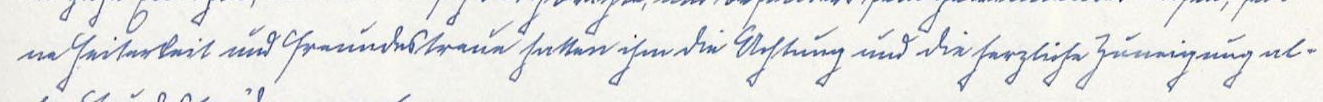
ne Heiterkeit und Freundestreue hatten ihm die Achtung und die herzliche Zuneigung al-
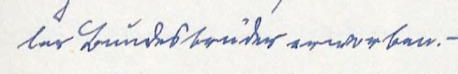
ler Bundesbrüder erworben.
